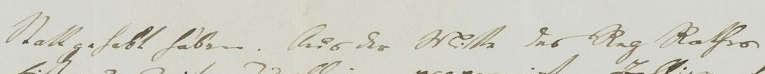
Statt gehabt haben. Aus der Mitte des RegRathes
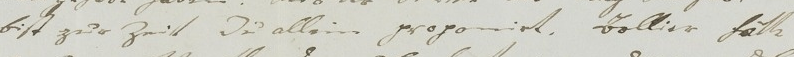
bist zur Zeit Du allein proponirt. Bollier hätte
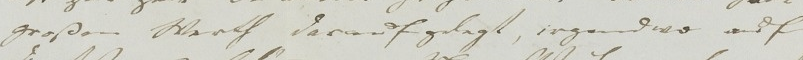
großen Werth daraufgelegt, irgendwo auf
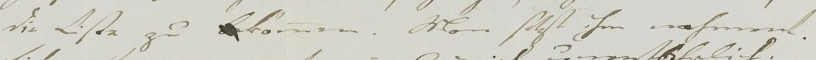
die Liste zu bekommen. Man setzt ihm nahment-
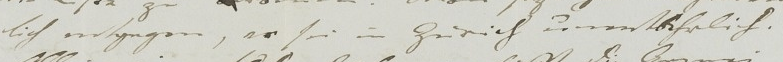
lich entgegen, er sei in Zürich unentbehrlich.
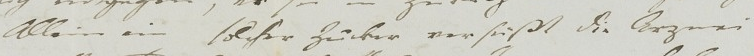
Allein ein solcher Zucker versüßt die Arznei
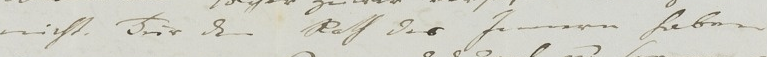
nicht. Für den Rath des Innern haben
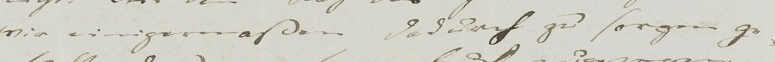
wir einigermaßen dadurch zu sorgen ge-
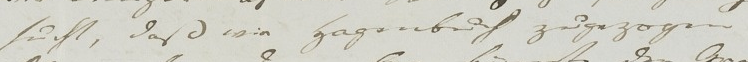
sucht, daß wir Hagenbuch zugezogen
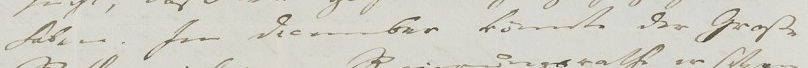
haben. Im December könnte der Große
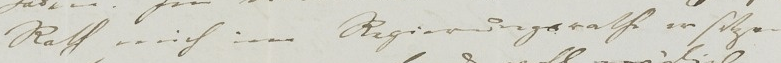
Rath mich im Regierungsrathe ersetzen
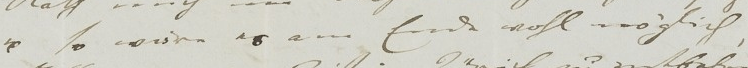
& so wäre es am Ende wohl möglich,
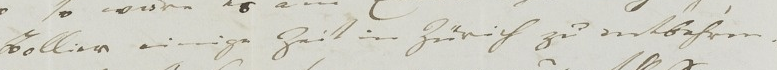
Bollier einige Zeit in Zürich zu entbehren. –
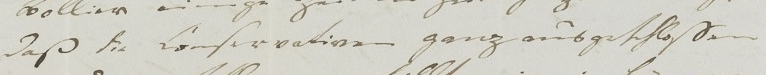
Daß die Conservativen ganz ausgeschlossen
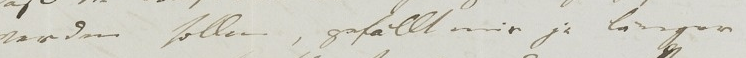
werden sollen, gefällt mir je länger
